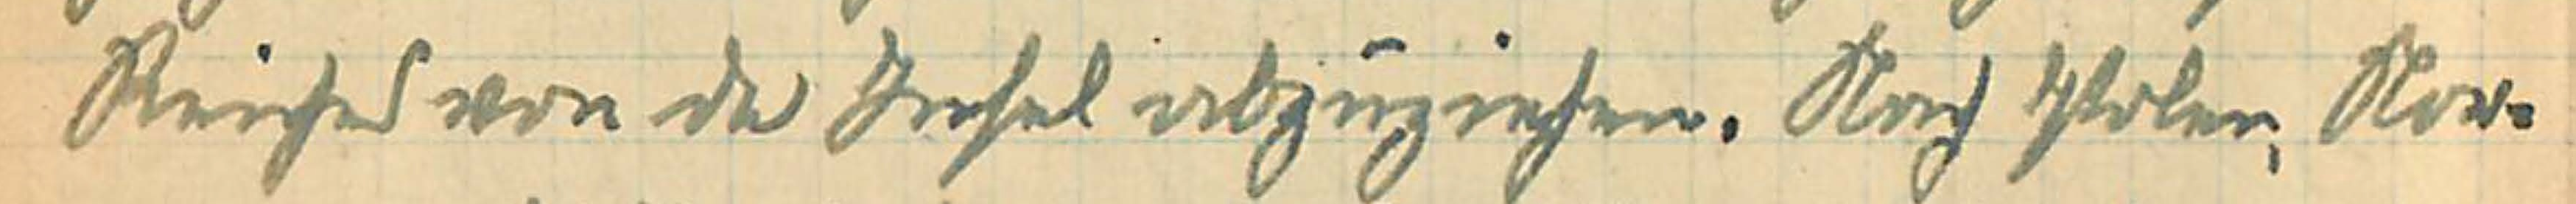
Reiches von der Insel abzuziehen. Nach Polen, Nor-
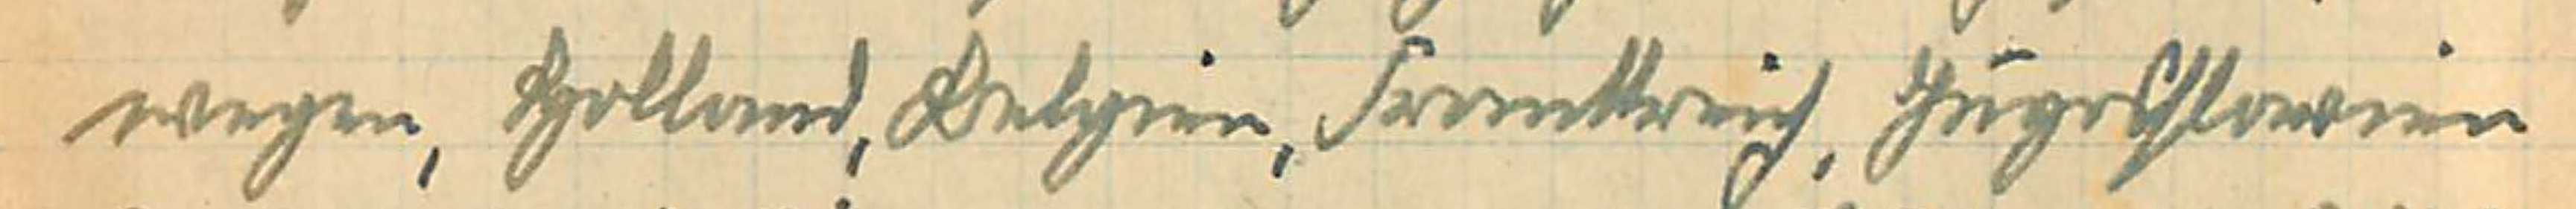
wegen, Holland, Belgien, Frankreich, Jugoslawien,
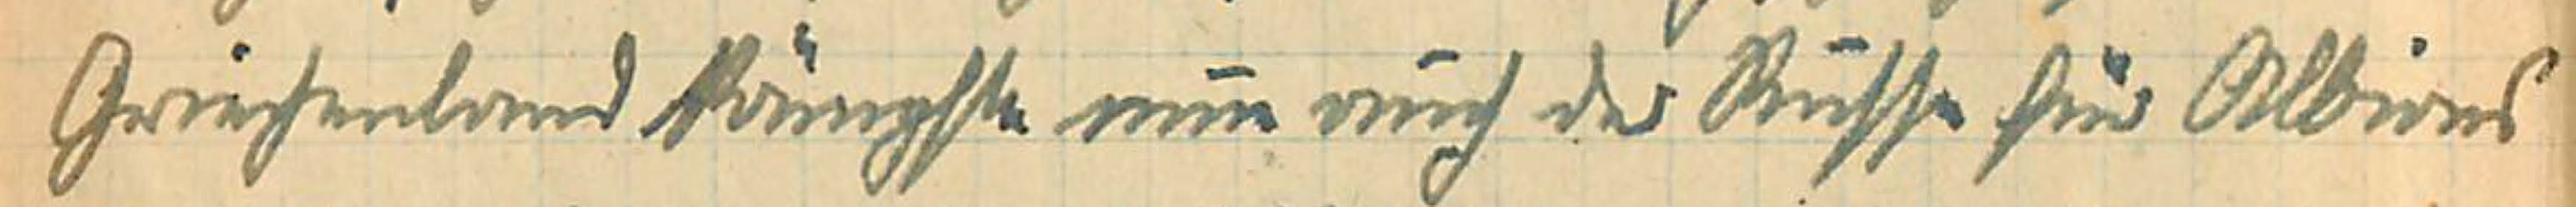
Griechenland kämpfte nun auch der Russe für Albions
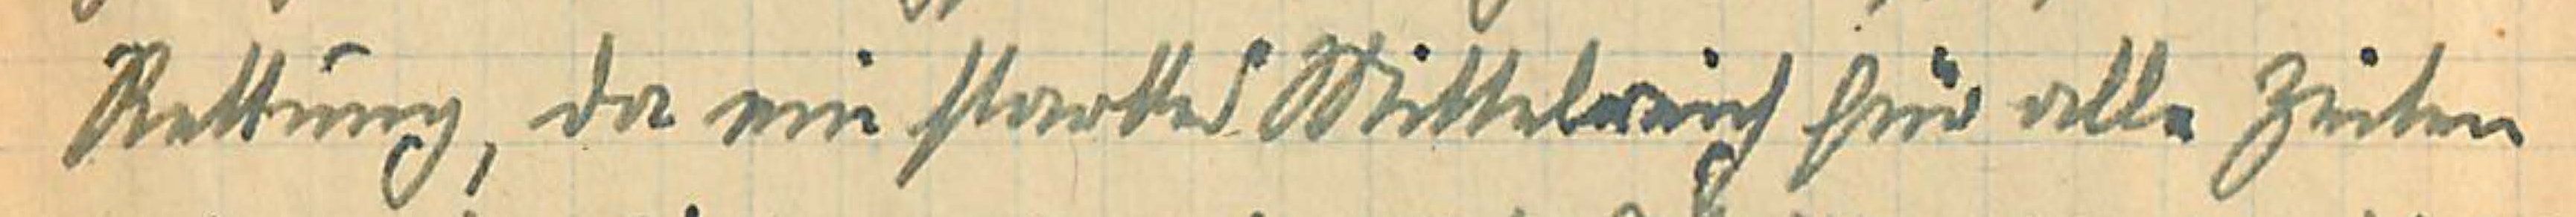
Rettung, da ein starkes Mittelreich für alle Zeiten
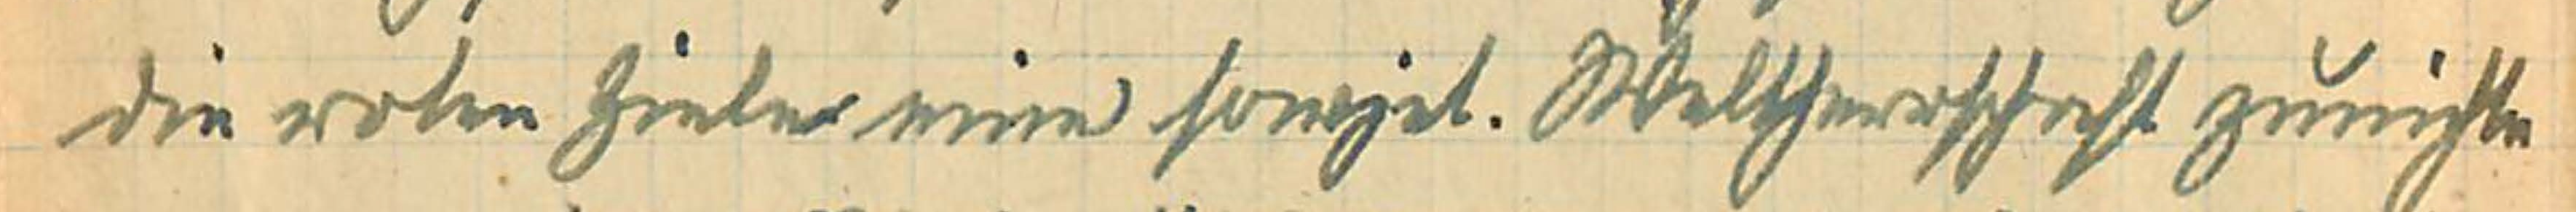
die roten Ziele einer sowjet. Weltherrschaft zunichte
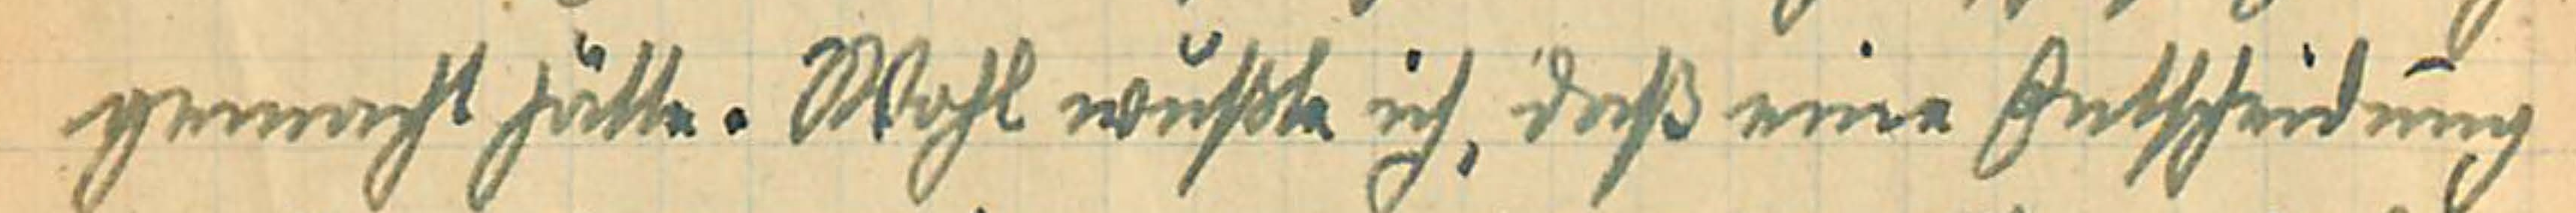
gemacht hätte. Wohl wußte ich, daß eine Entscheidung
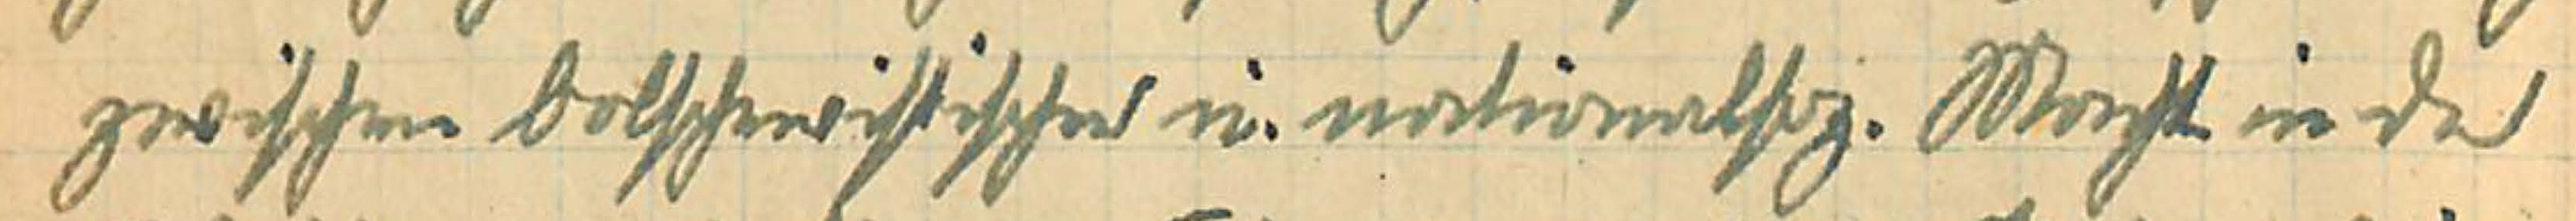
zwischen bolschewistischer u. nationalsoz. Macht in der
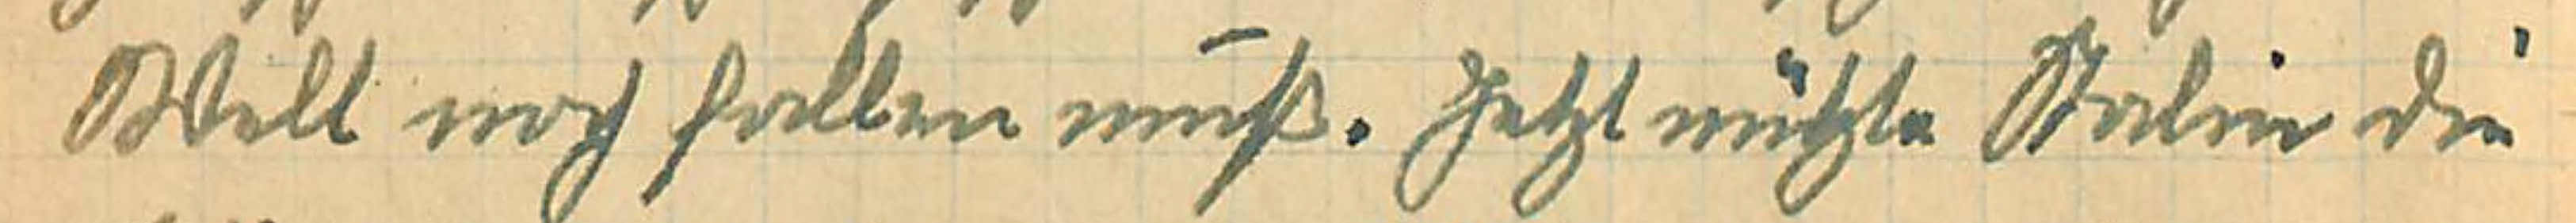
Welt noch fallen muß. Jetzt nützte Stalin die
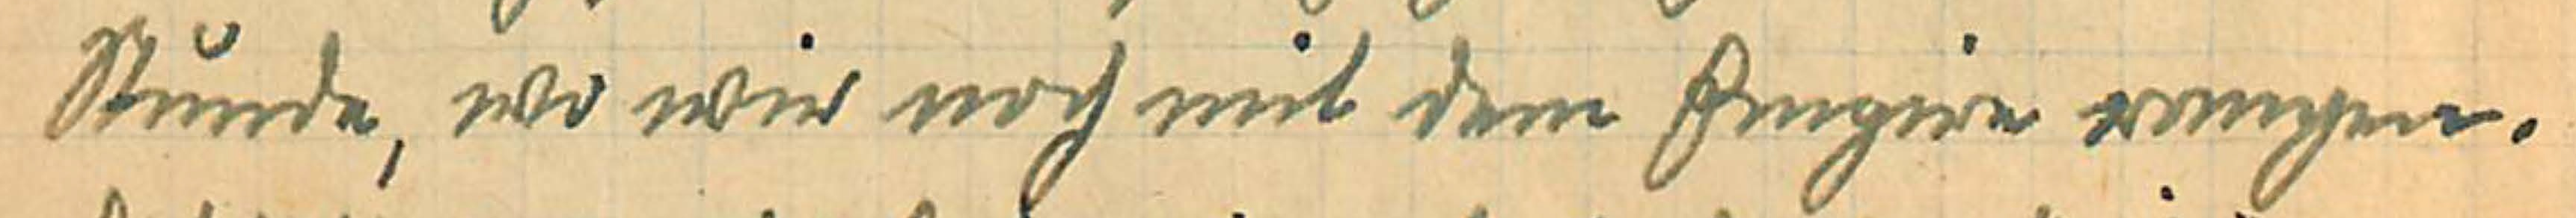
Stunde, wo wir noch mit dem Empire rangen.
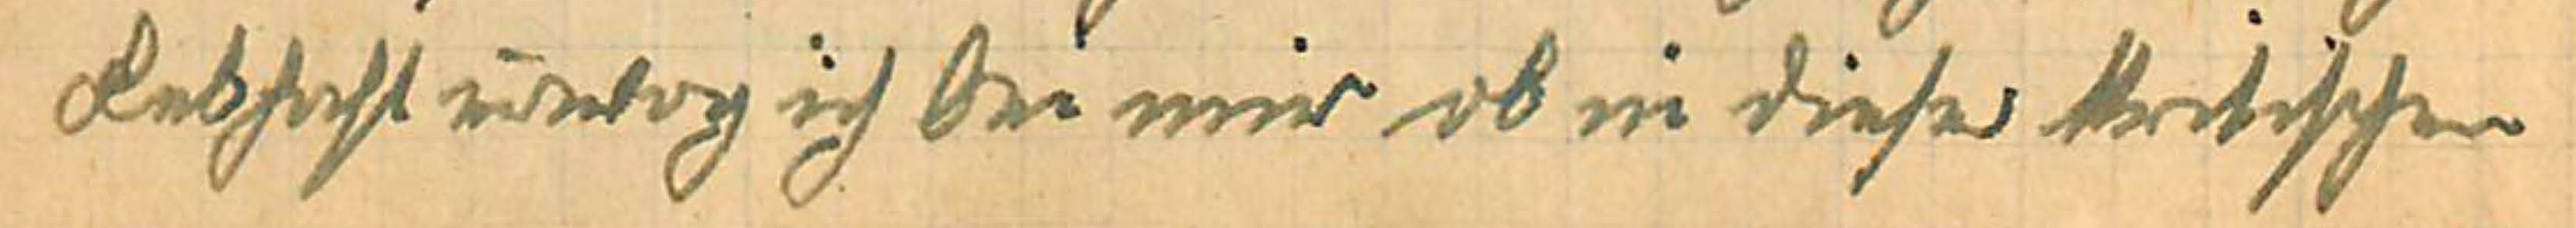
Lebhaft erwog ich bei mir ob in dieser kritischen
